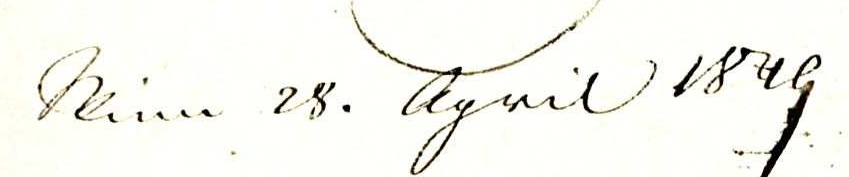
Wien 28. April 1849
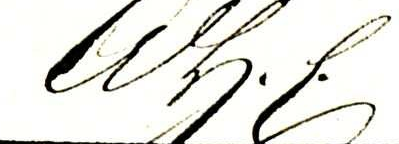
AH. E.
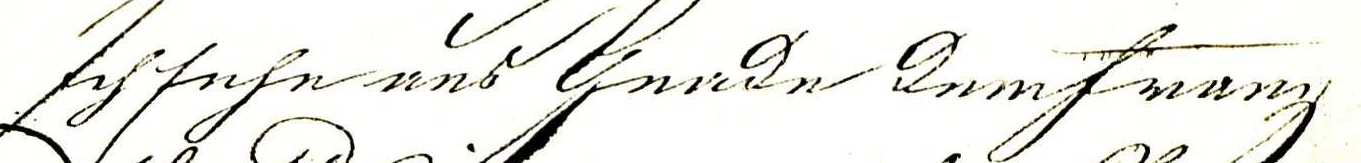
Ich sehe aus Gnade dem Franz
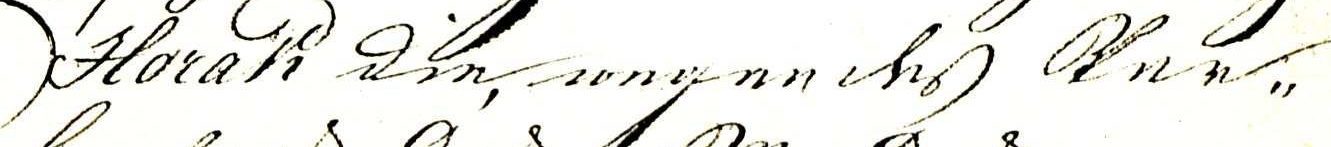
Horak die, wegen des Ver¬
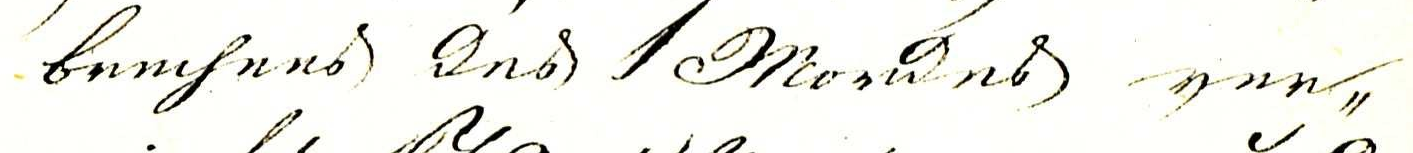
brechens des Mordes ver¬
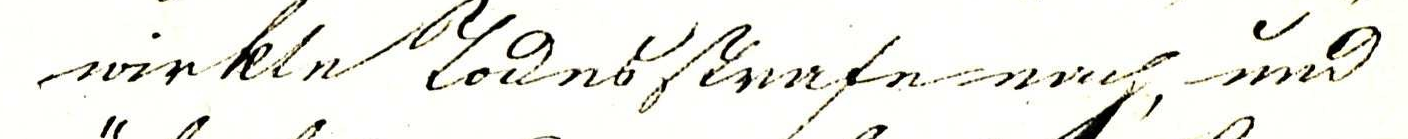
wirkte Todesstrafe nach, und
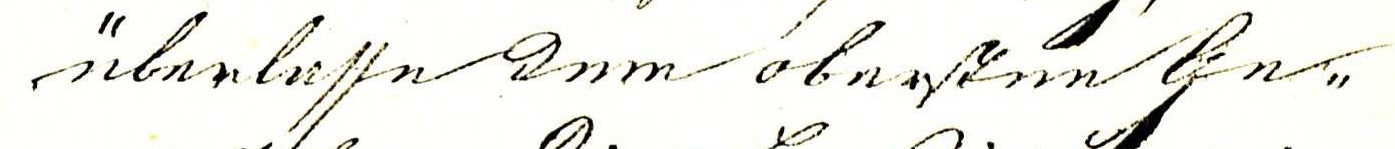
überlasse dem obersten Ge¬
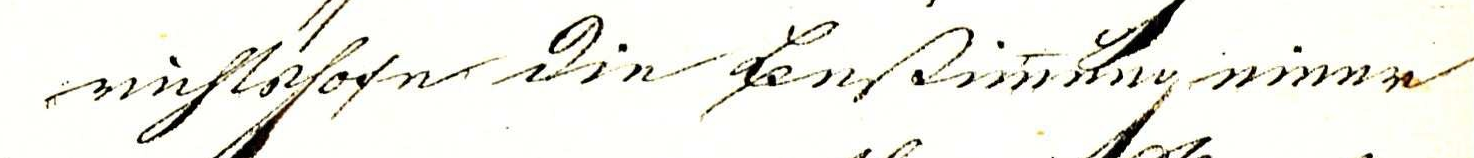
richtshofe die Bestimmung einer
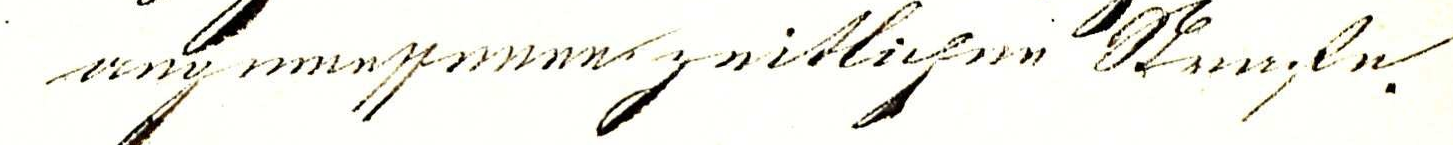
angemessenen zeitlichen Strafe.
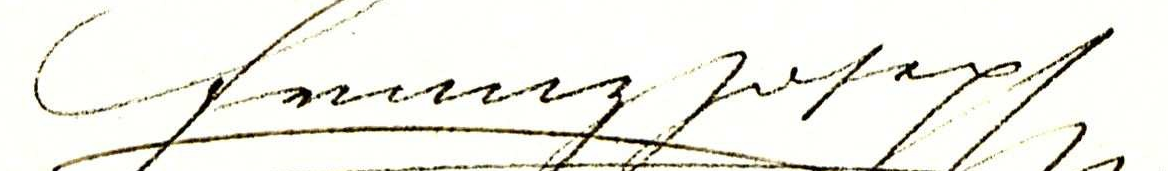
Franz Joseph
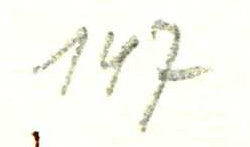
147
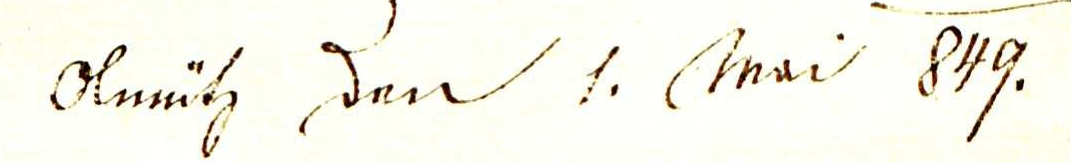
Olmütz den 1. Mai 849
